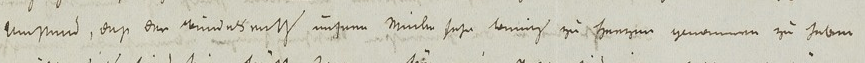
Umstand, daß der Bundesrath unsere Winke sehr wenig zu Herzen genommen zu haben
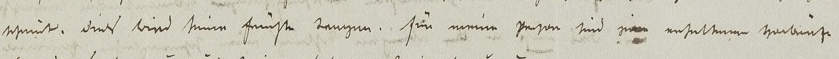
scheint. Dies wird seine Früchte tragen. Für meine Person sind jene erhaltenen Vorwürfe
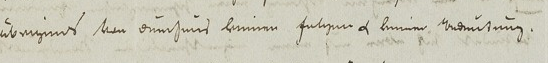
übrigens von durchaus keinen Folgen & keiner Bedeutung.
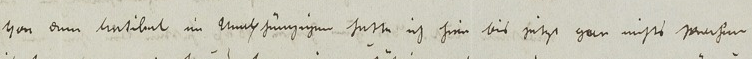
Von dem Artikel im Unabhängigen hatte ich hier bis jetzt gar nichts sprechen
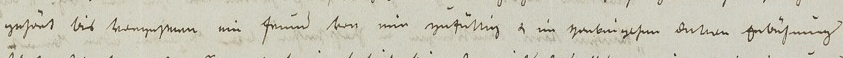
gehört bis vorgestern ein Freund von mir zufällig & im Vorbeigehen davon Erwähnung
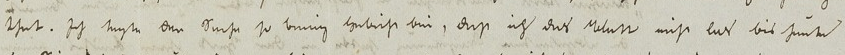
that. Ich legte der Sache so wenig Gewicht bei, daß ich das Blatt nicht las bis heute
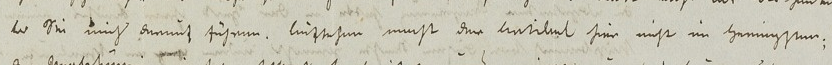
wo Sie mich darauf führen. Aufsehen macht der Artikel hier nicht im Geringsten;
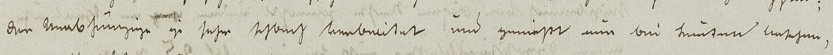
der Unabhängige ist sehr schwach verbreitet und genießt nur bei Leuten Ansehen,
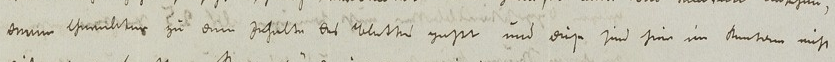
deren Charakter zu dem Inhalte des Blattes paßt und diese sind hier im Kanton nicht
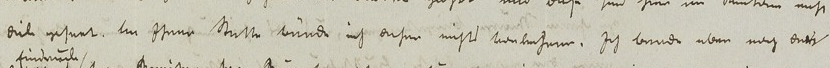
dick gesaet. An Ihrer Stelle würde ich daher nichts vorkehren. Ich werde aber noch Dubs-
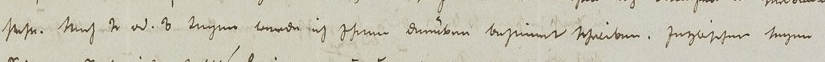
stehe. Nach 2 oder 3 Tagen werde ich Ihnen darüber bestimmt schreiben. Inzwischen legen
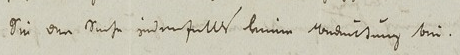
Sie der Sache jedenfalls keine Bedeutung bei.
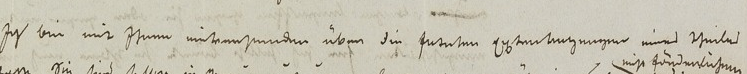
Ich bin mit Ihnen einverstanden über die fatalen Extravaganzen eines Theiles
